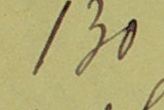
130
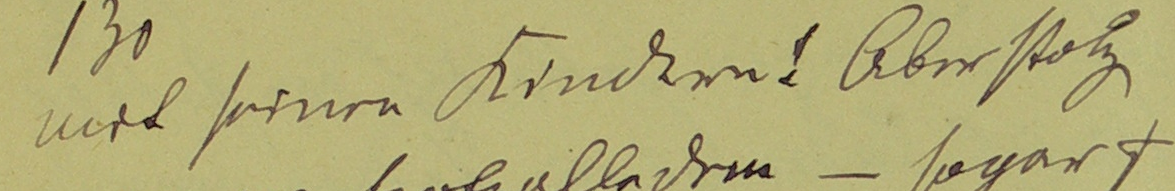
mit seinen Kindern! Aber stolz
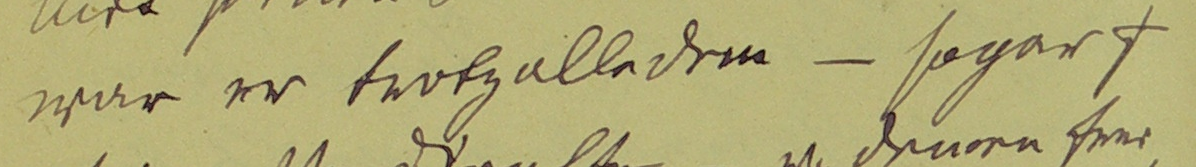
war er trotzalledem - sogar f
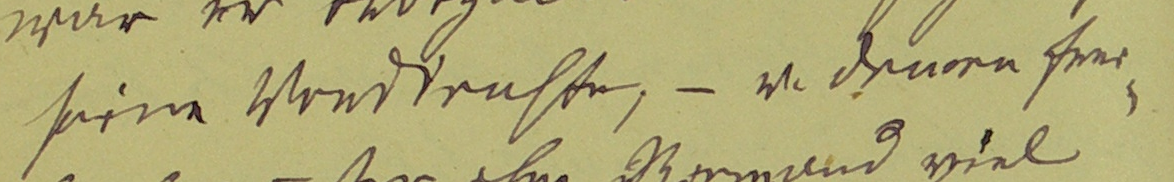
seine Verdienste, - v. denen frei¬
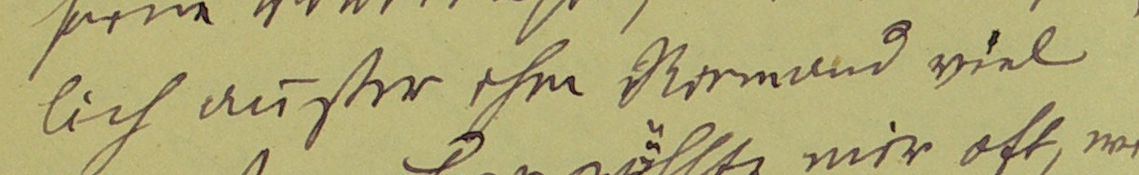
lich außer ihm Niemand viel
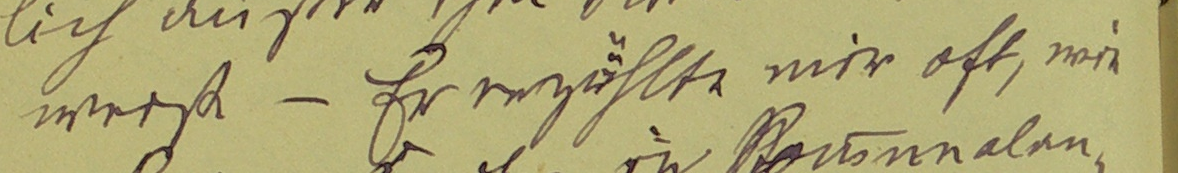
weiß - Er erzählte mir oft, wie
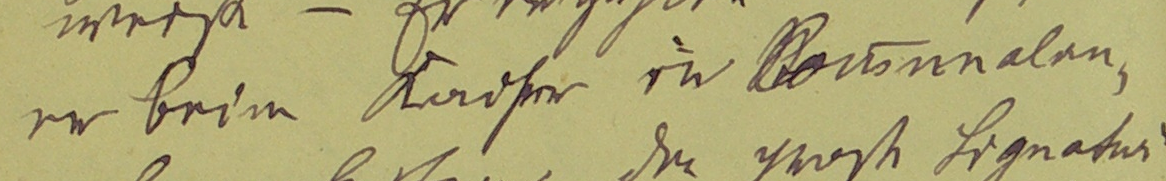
er beim ??? in Communalan¬
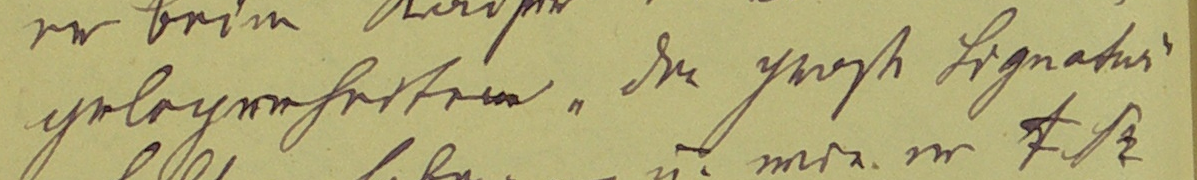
gelegenheiten „Die große Signatur“
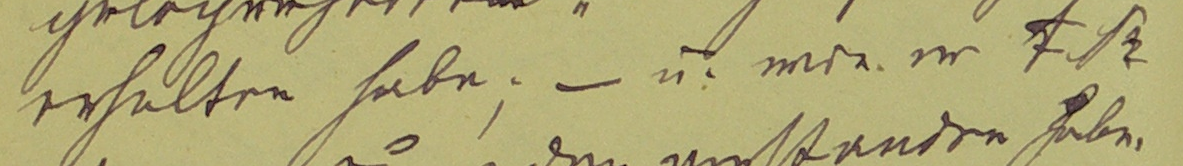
erhalten habe; - u. wie er ???
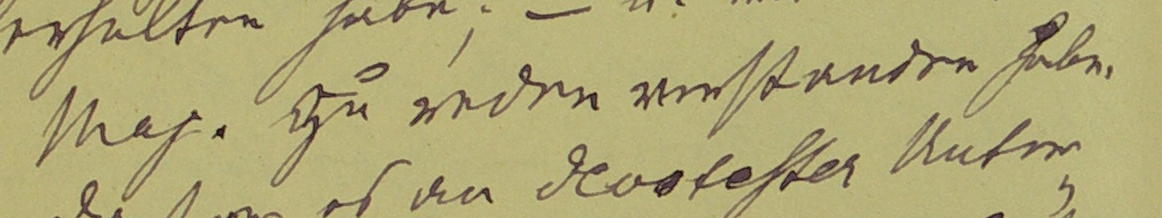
Mag. zu reden verstanden habe.
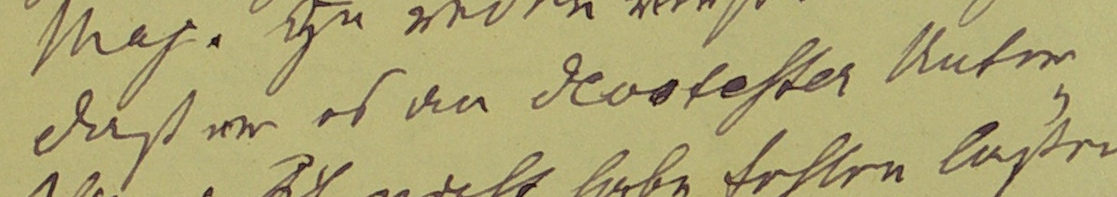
Daß er es an devotester Unter¬
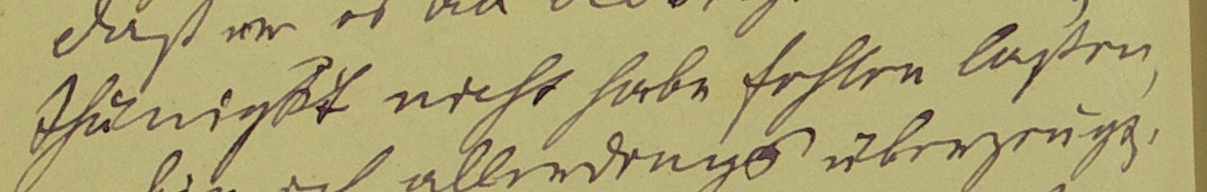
thänigkeit nicht habe fehlen laßen,
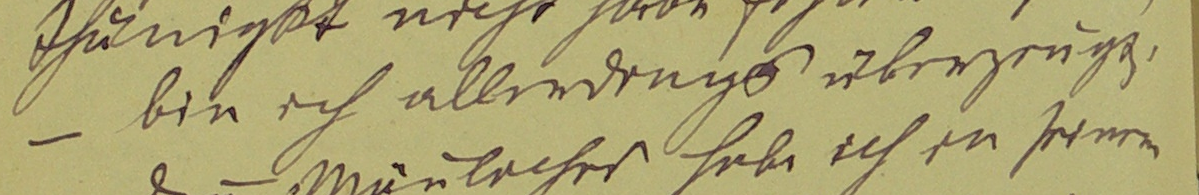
- bin ich allerdings überzeugt
